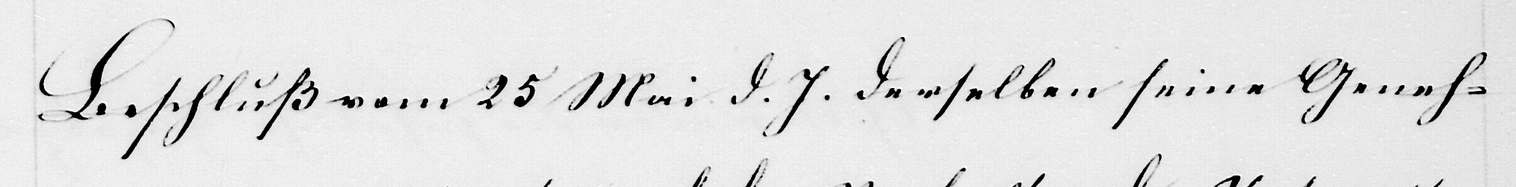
Beschluß vom 25 Mai d. J. derselben seine Geneh¬
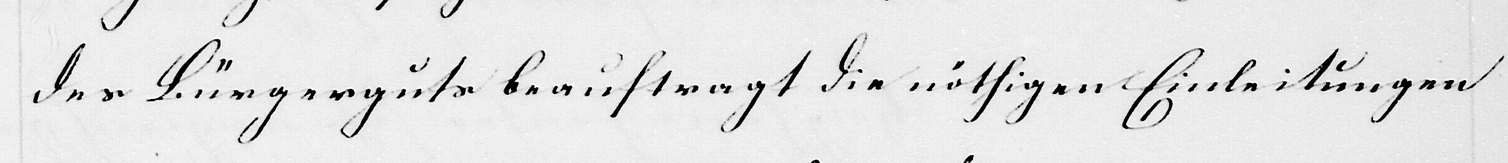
des Bürgerguts beauftragt die nöthigen Einleitungen
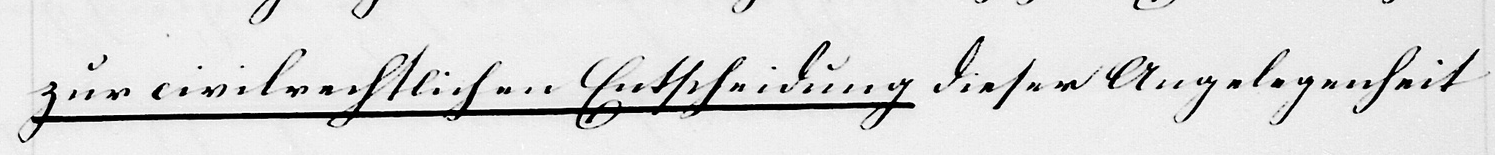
zur civilrechtlichen Entscheidung dieser Angelegenheit
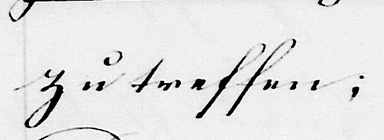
zu treffen;
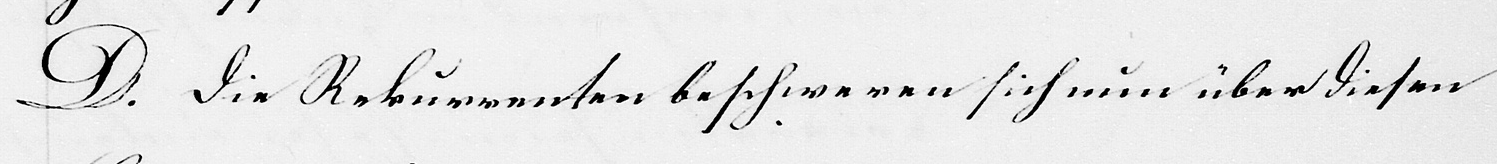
D. Die Rekurrenten beschweren sich nun über diesen
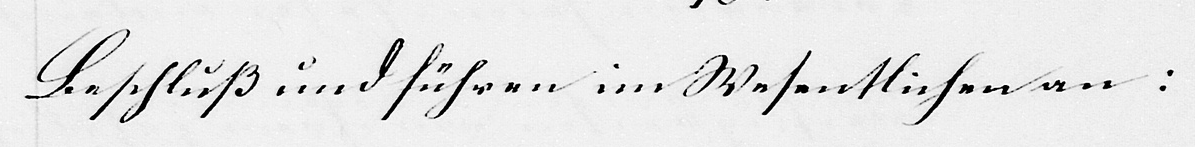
Beschluß und führen im Wesentlichen an:
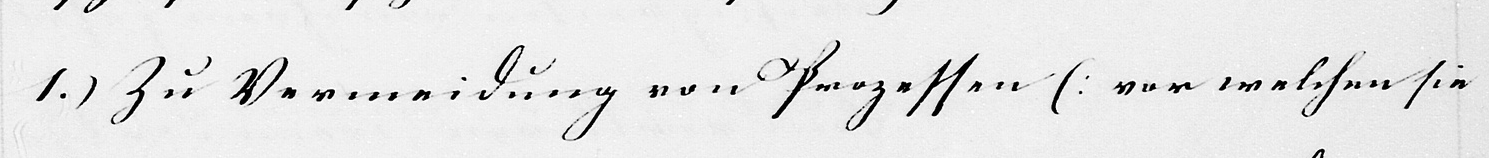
1.) Zu Vermeidung von Prozessen [vor welchen sie
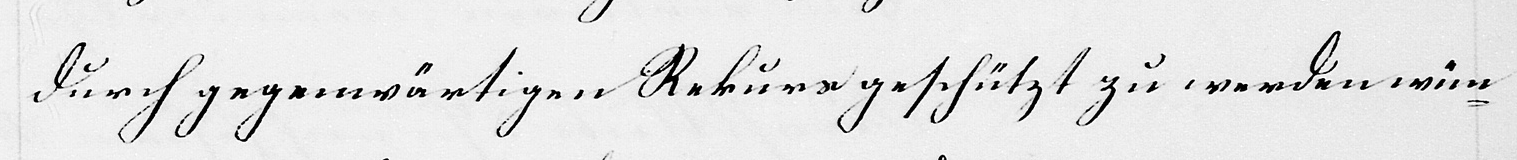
durch gegenwärtigen Rekurs geschützt zu werden wün¬
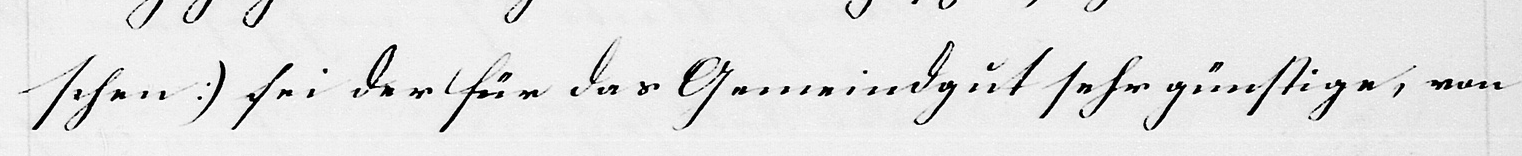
schen] sei der für das Gemeindgut sehr günstige, von
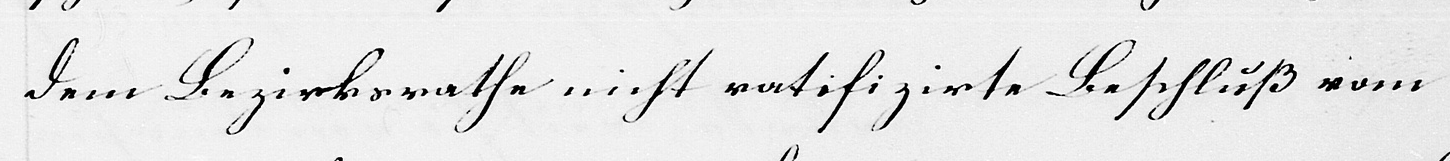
dem Bezirksrathe nicht ratifizirte Beschluß vom
